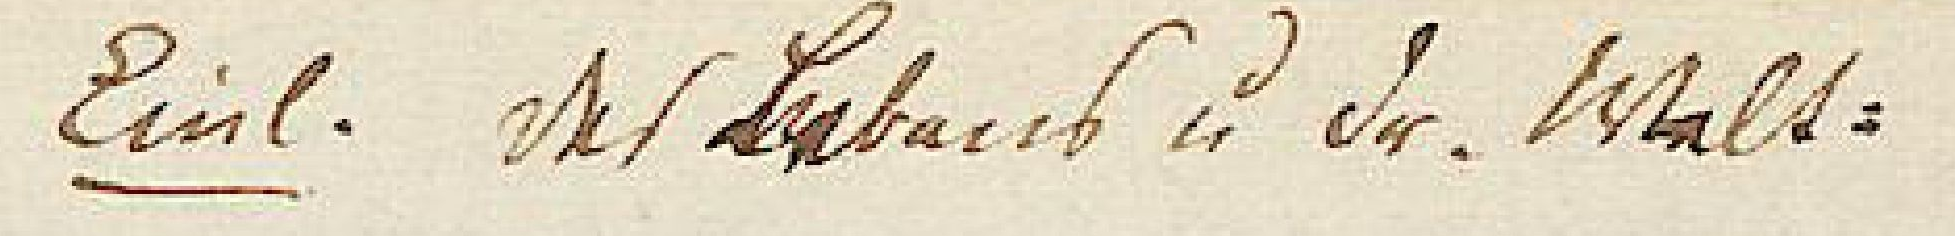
Einl. des Lebens u dr. Welt:
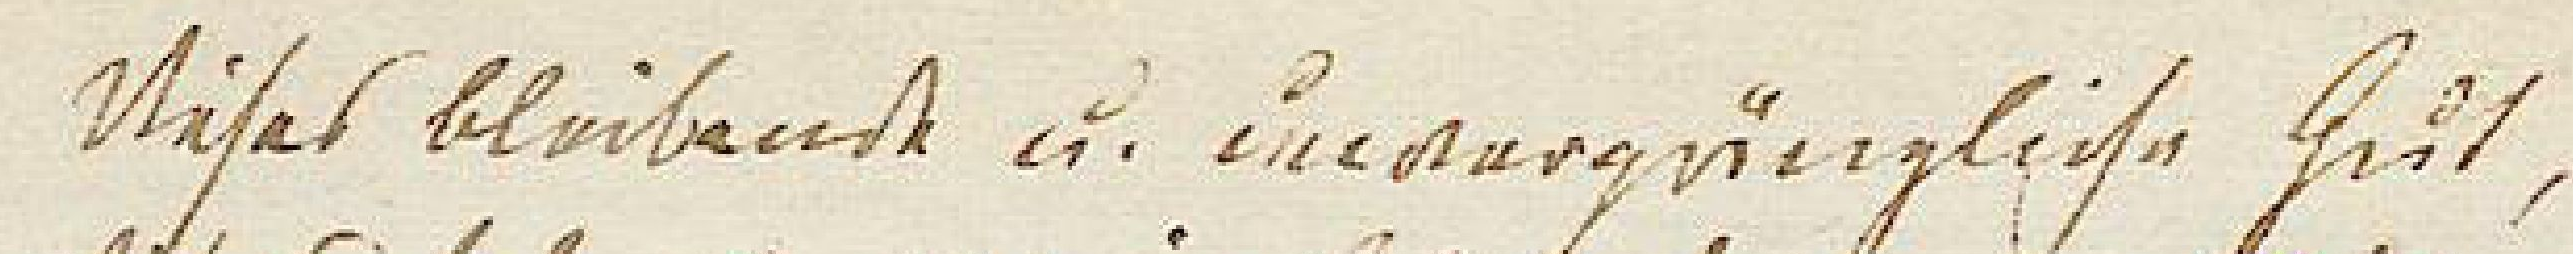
Dieses bleibende u. unvergängliche Gut,
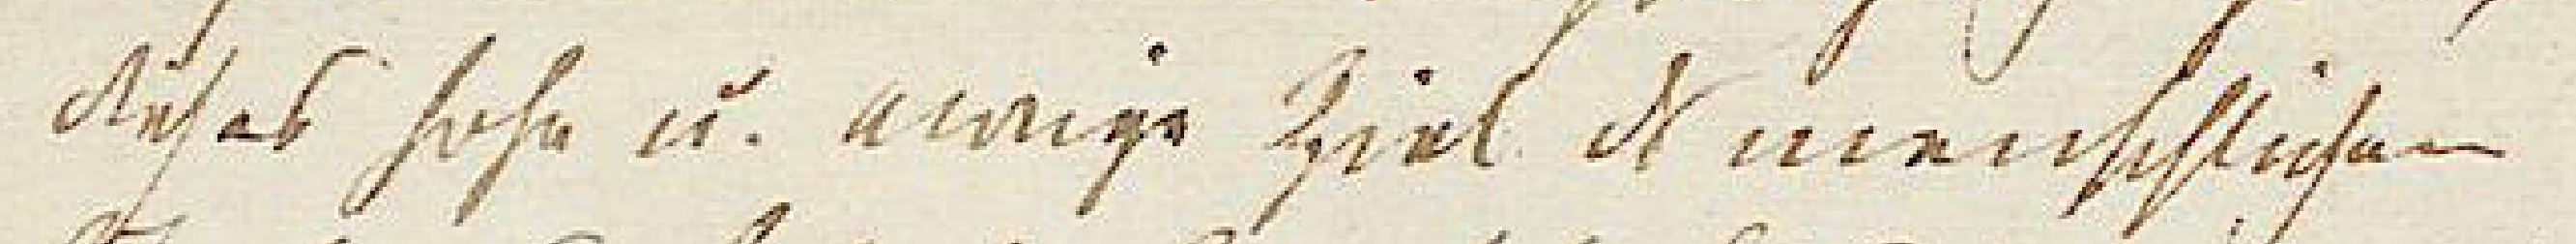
dieses hohe u. ewige Ziel ds menschlichen
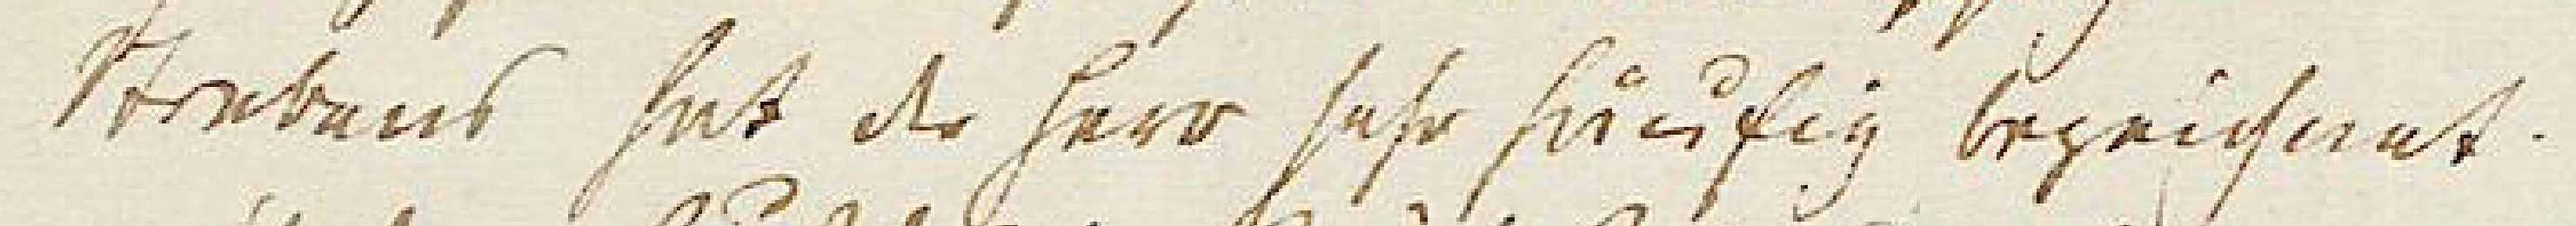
Strebens hat der Herr sehr fähig bezeuchnet
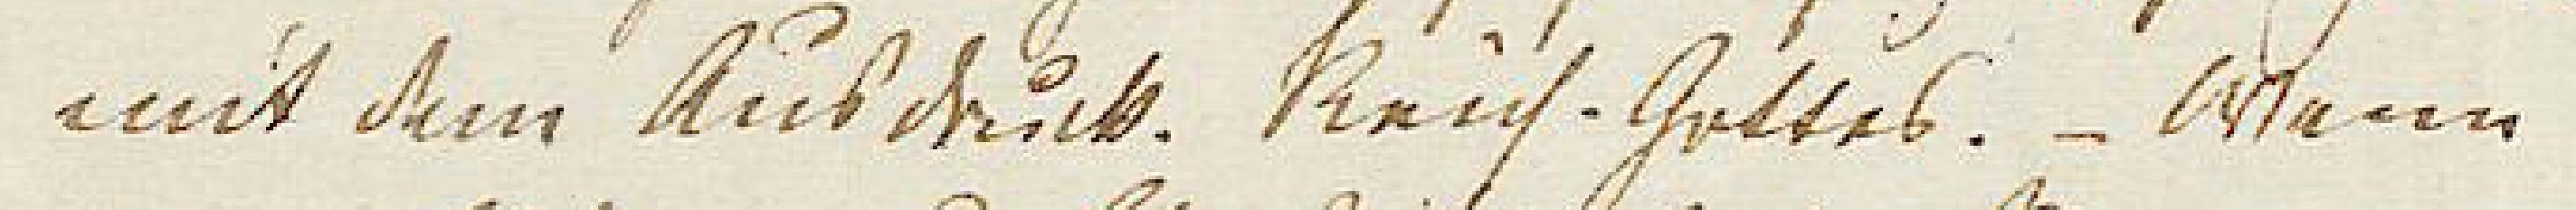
mit dem Ausdruck. Reich Gottes. _ Wenn
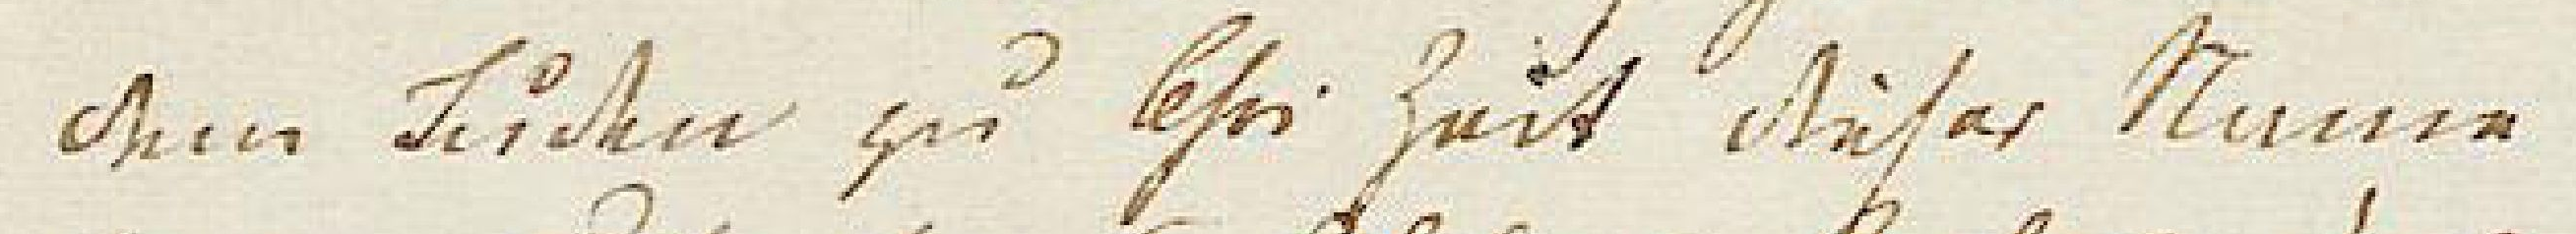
den Juden zu Chri Zeit dieser Name
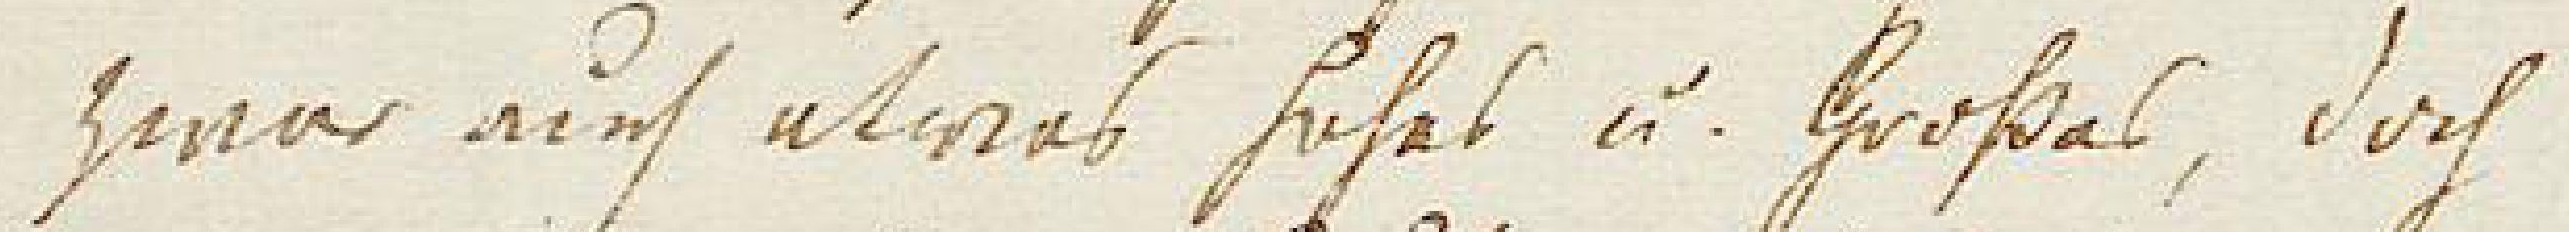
zwar auch etwas Hohes u. Großes, doch
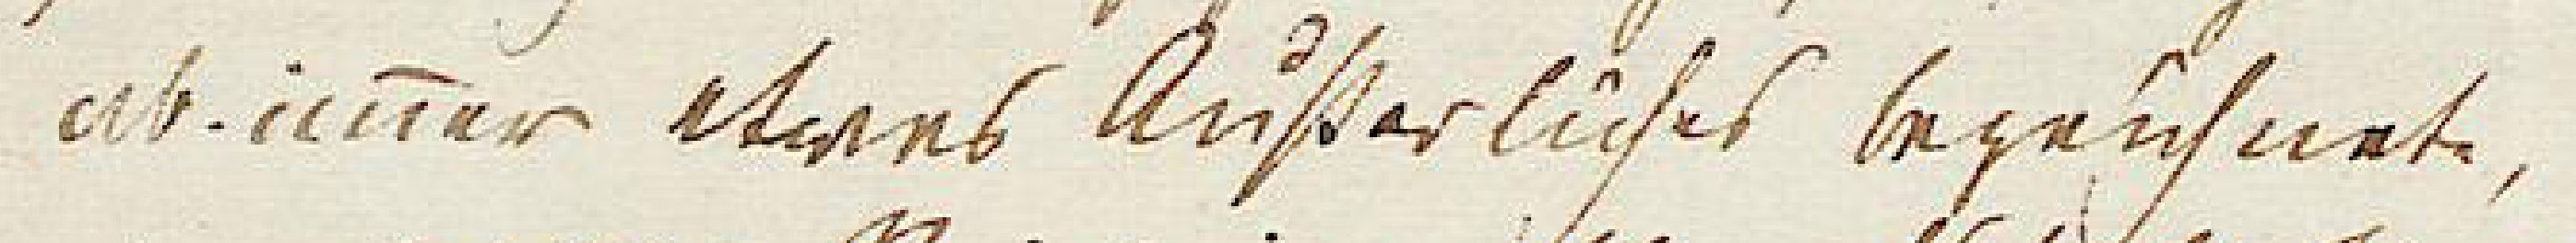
ab. imer etwas Äußerliches bezeichnete,
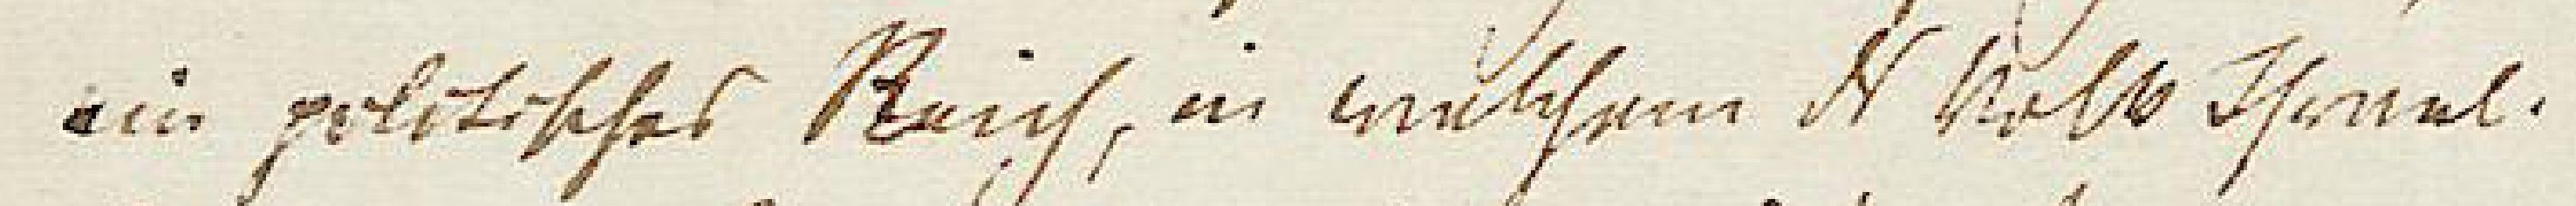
ein politisches Reich, in welchem ds Volk Israel.
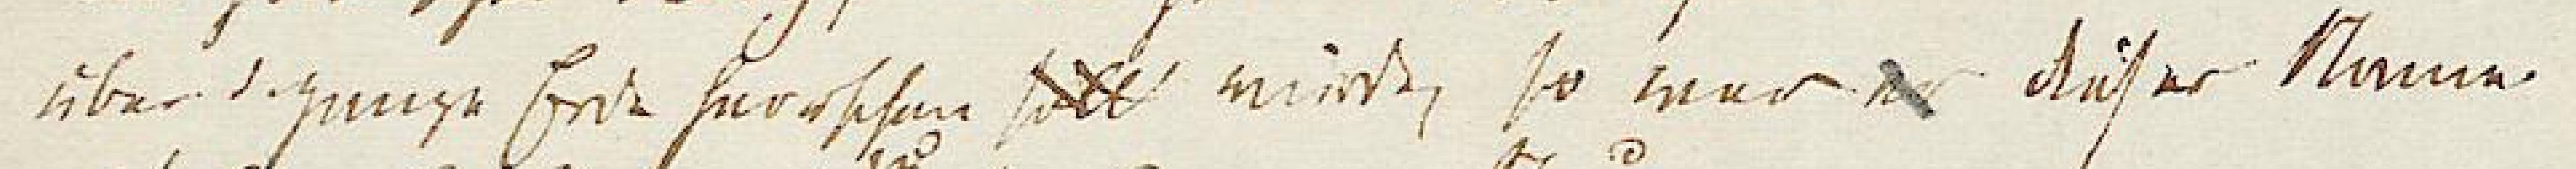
über d. ganze Erde herrschen soll würde, so war nur dieser Name
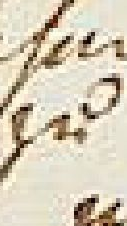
zu
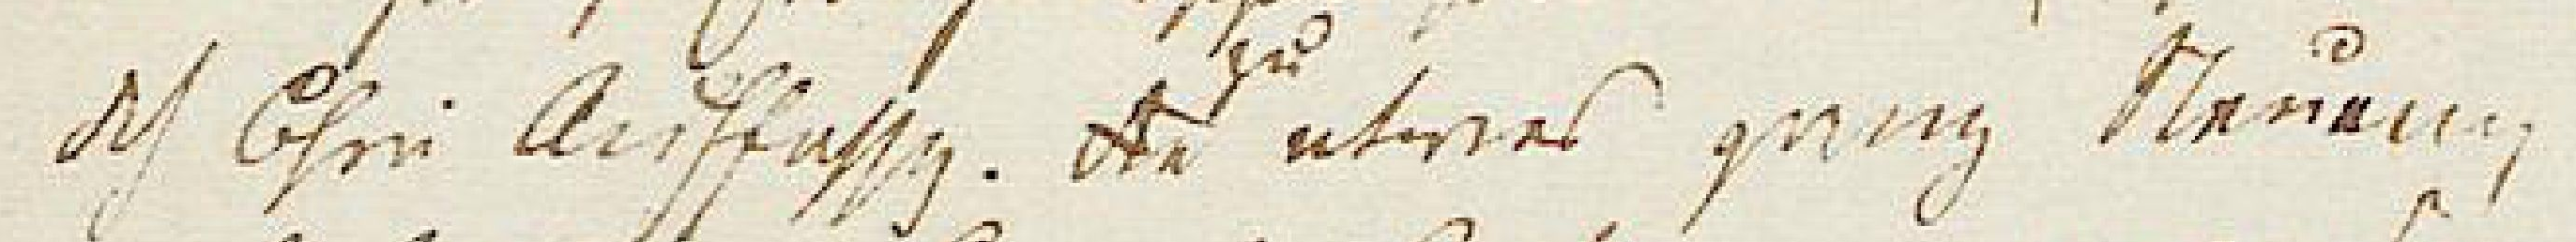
dch Chri Auffassg. Da etwas ganz Neuem,
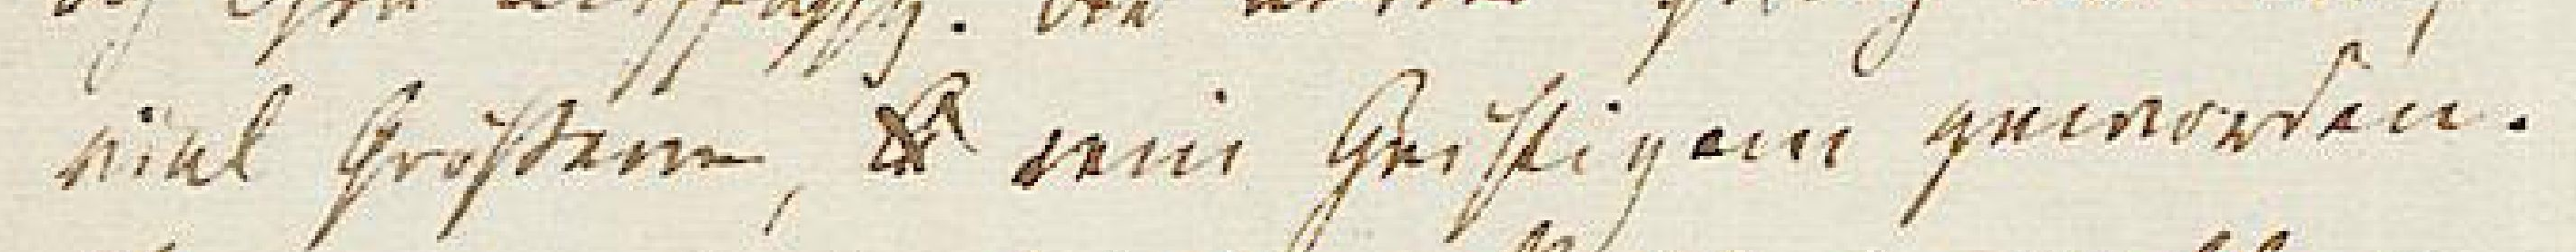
viel Größerem, A rein Geistigem geworden.
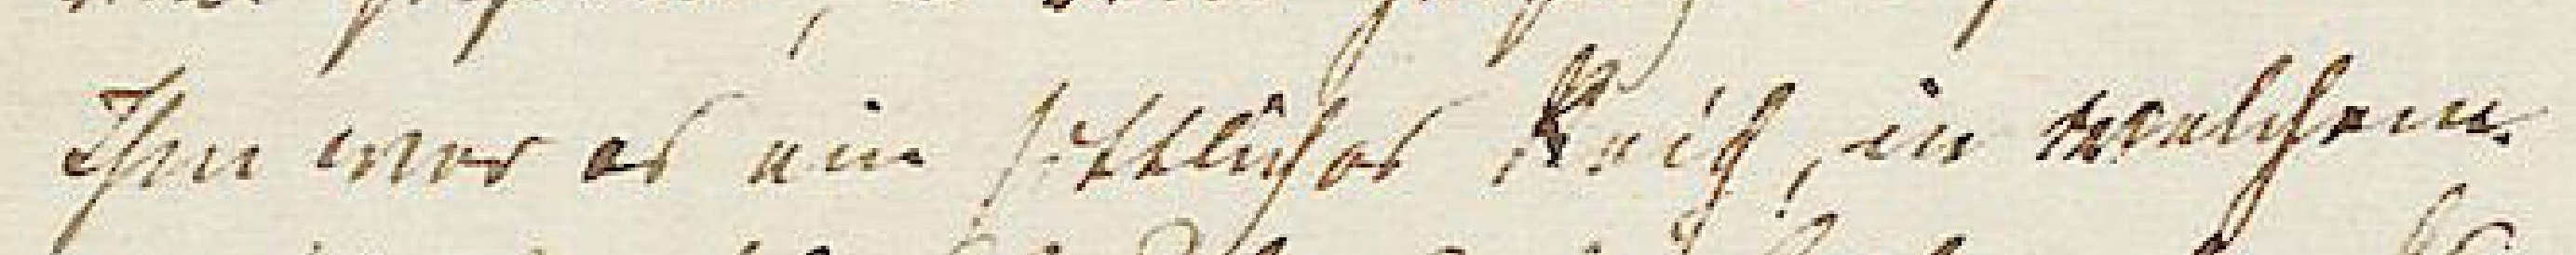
Ihm war es ein sittliches Reich, in welchem
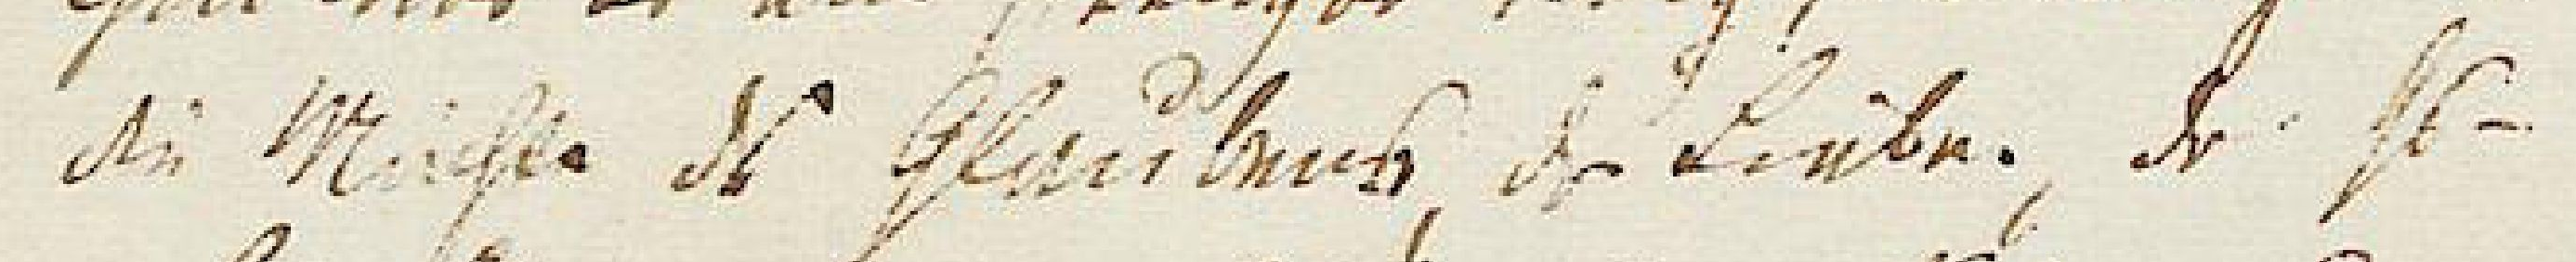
die Mächte ds Glaubens der Liebe, dr Gs¬
